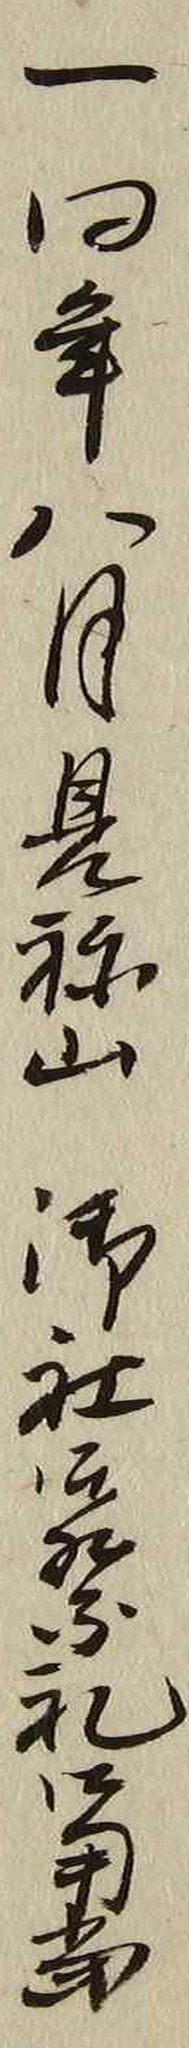一同年八月見禰山御社御祭礼御用当
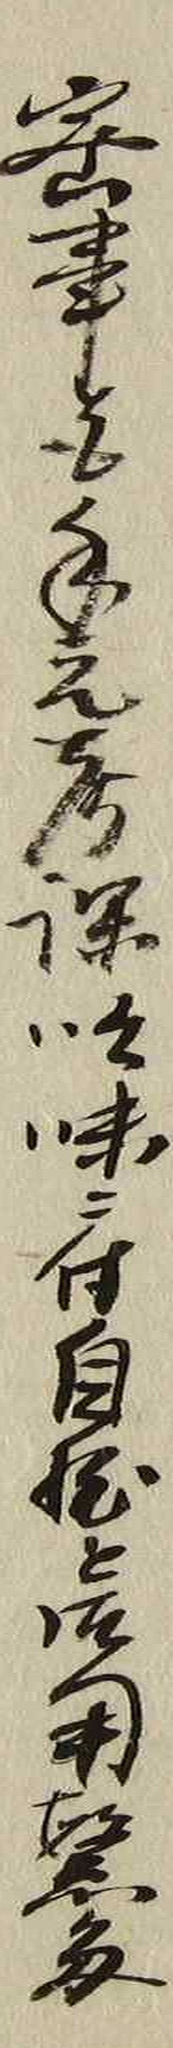密事とも手元考課吟味付自然と御用繁多
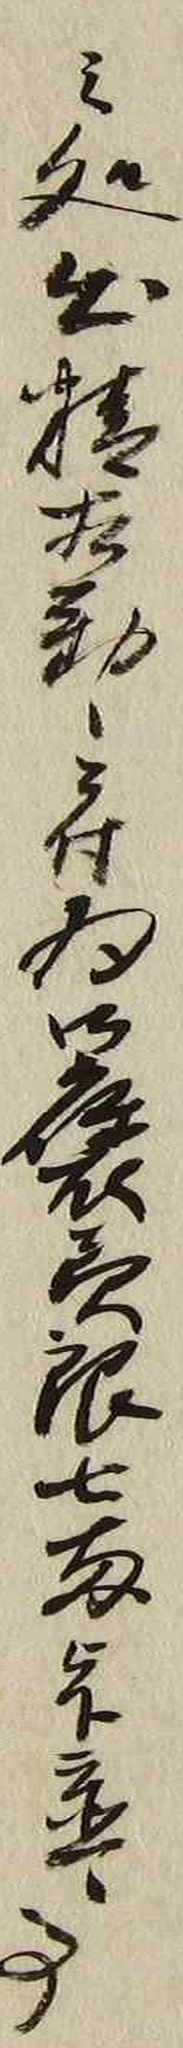之処出精相勤候付為御褒御美銀七両被下置候事
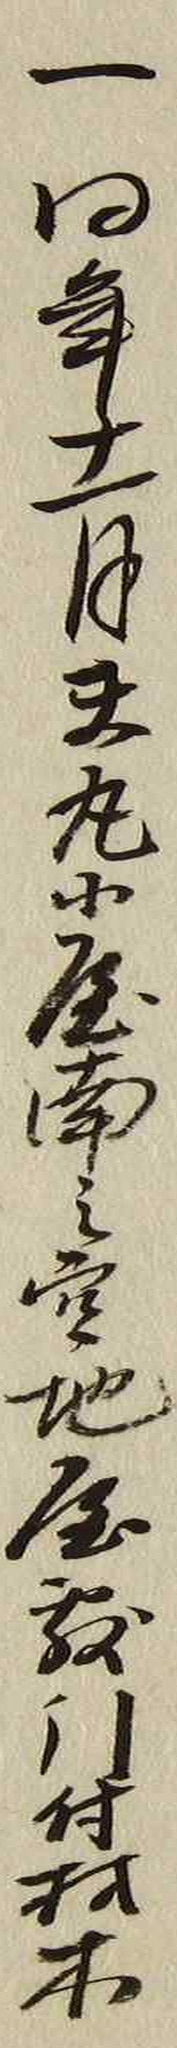一同年十一月夫丸小屋南之空地屋敷引付材木
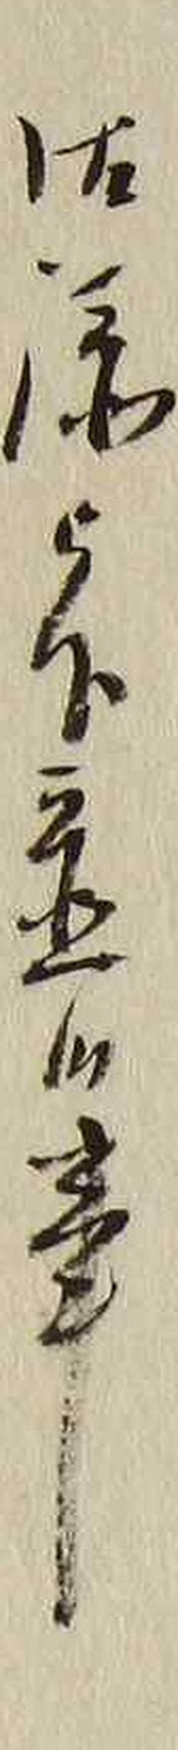御添被下置候事
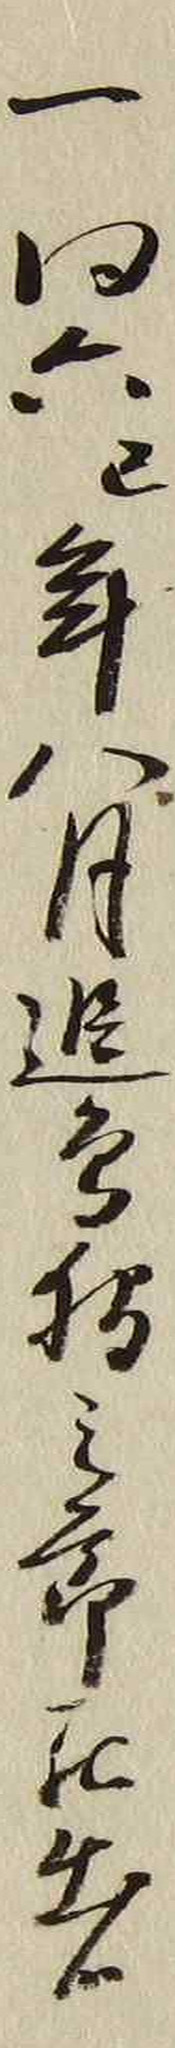一同六巳年八月追鳥狩之節罷出候
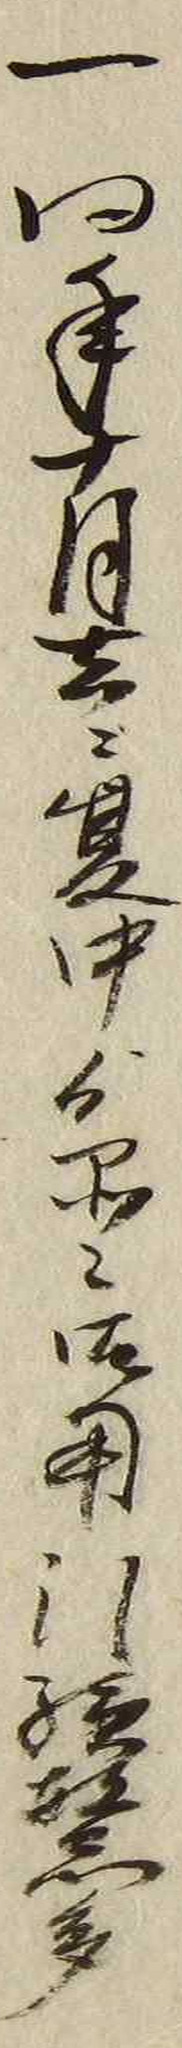一同年十月去々夏中ゟ品々四用引続繁多

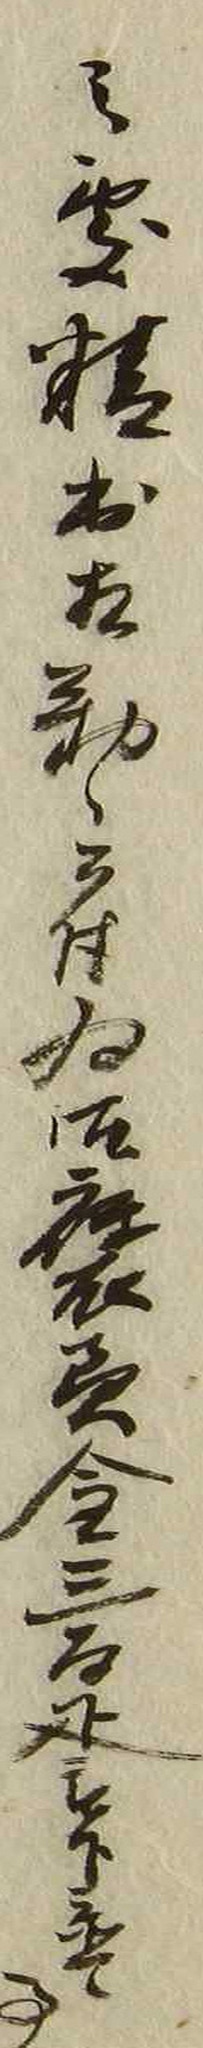之処精出相勤候付為御褒美金三百疋被下置候事
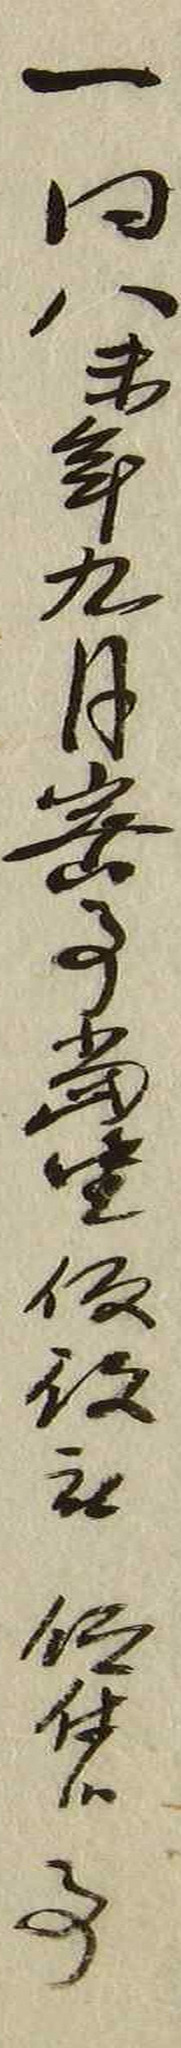一同八未年九月密事当坐仮役被仰付候事
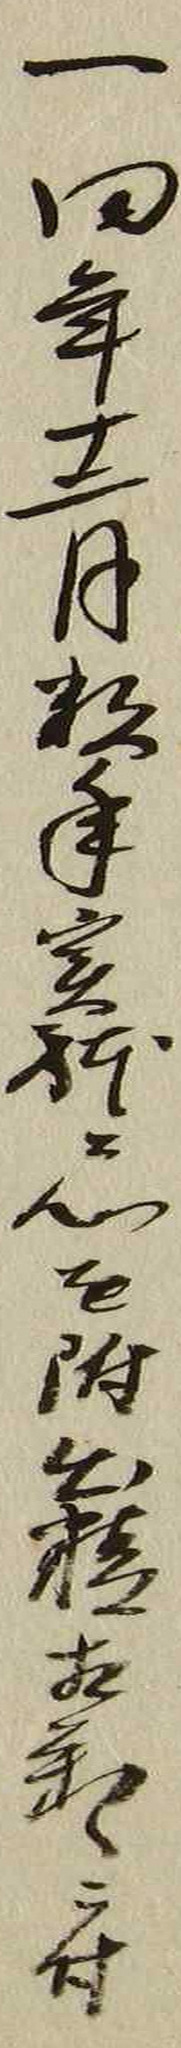一同年十二月数年実体心を附出精相勤付
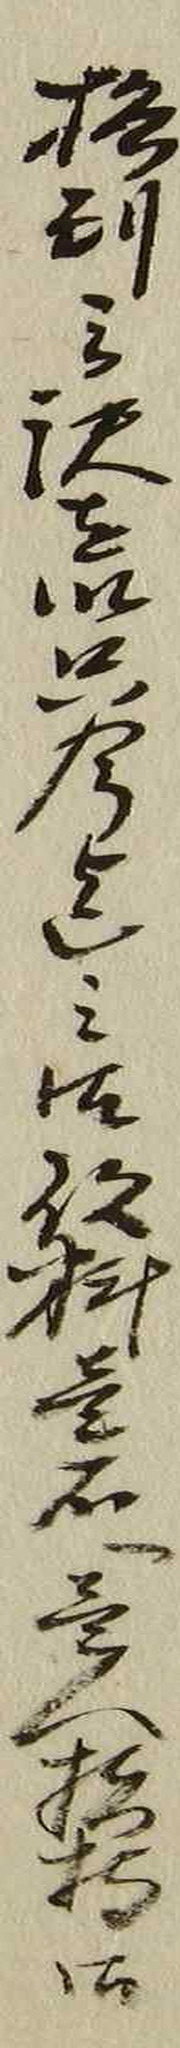格別之訳を以只今之御役料壱石壱人扶持御
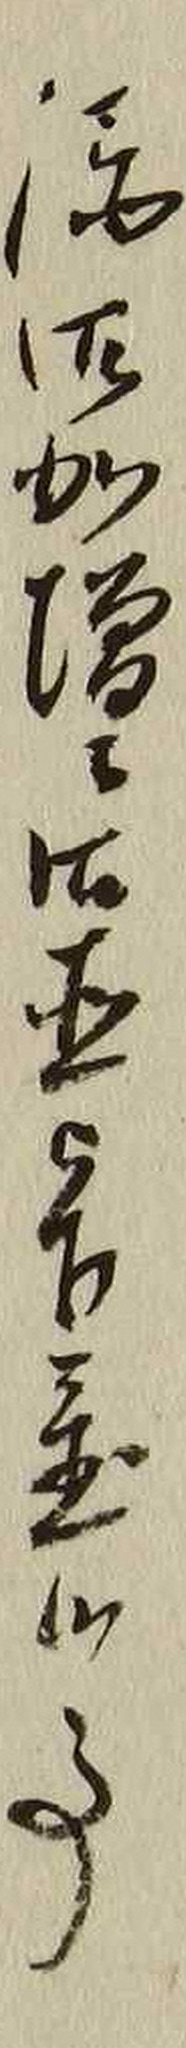添御加増御直被下置候事
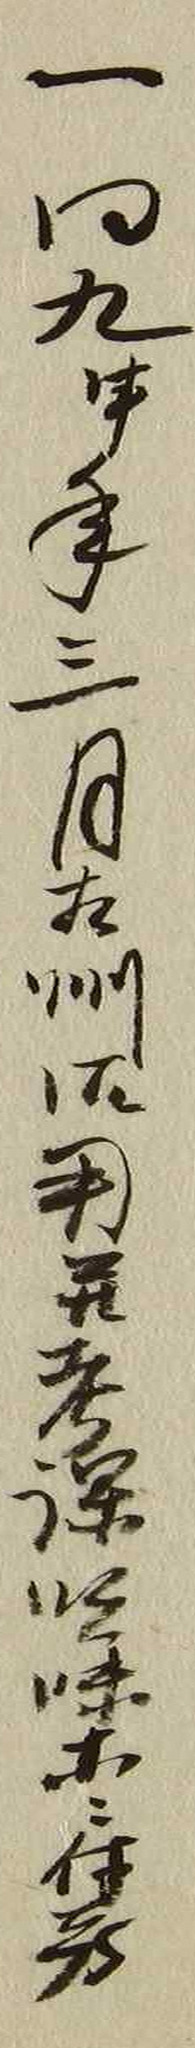一同九申年三月相州御用并考課吟味等付旁
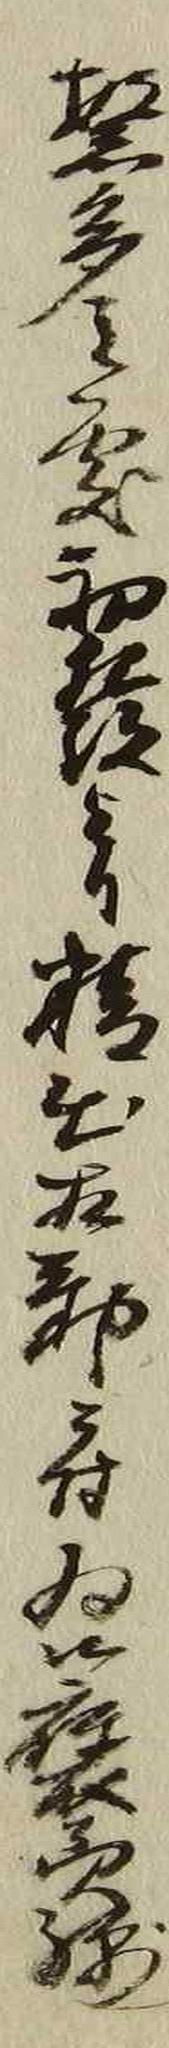繁多之処初発より精出相勤付為御褒美綿
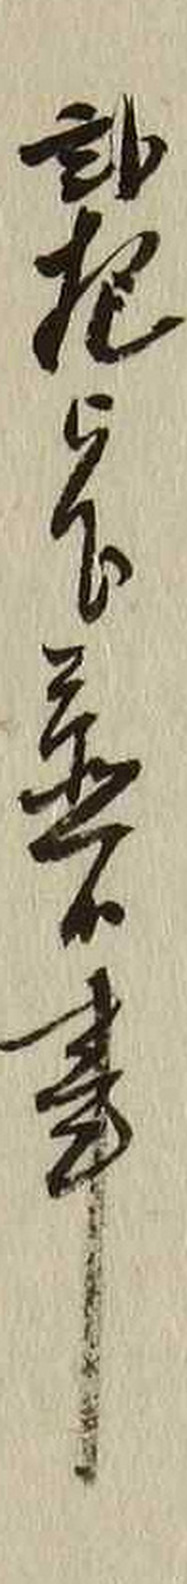弐把被下置候事
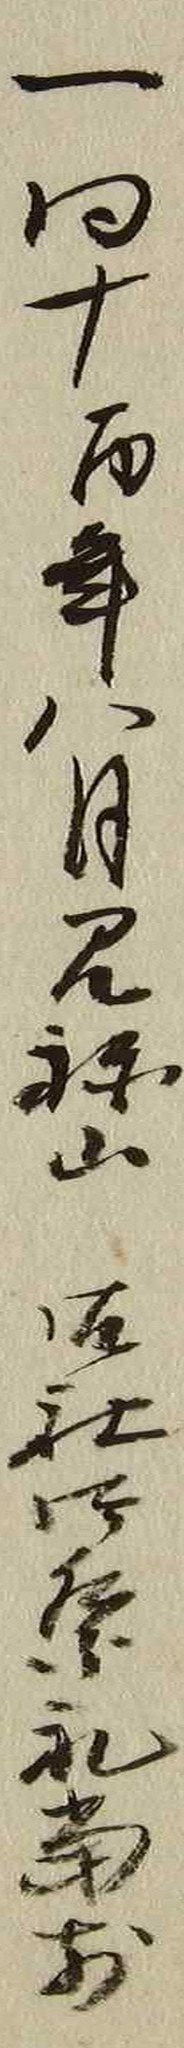一同十酉年八月見禰山御社祭礼当前
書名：諸士系譜　巻之350　せ之部1冊全
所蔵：会津若松市立会津図書館
